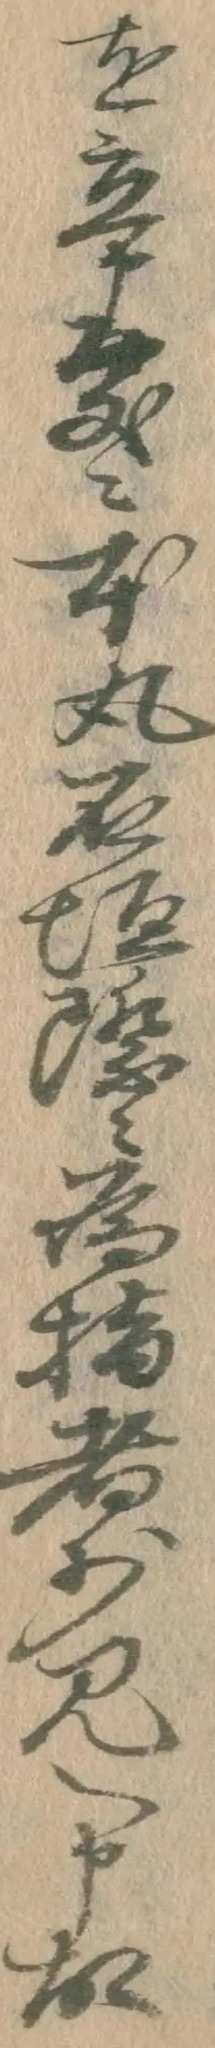を立申處に本丸石垣際に為指者少見へ申故
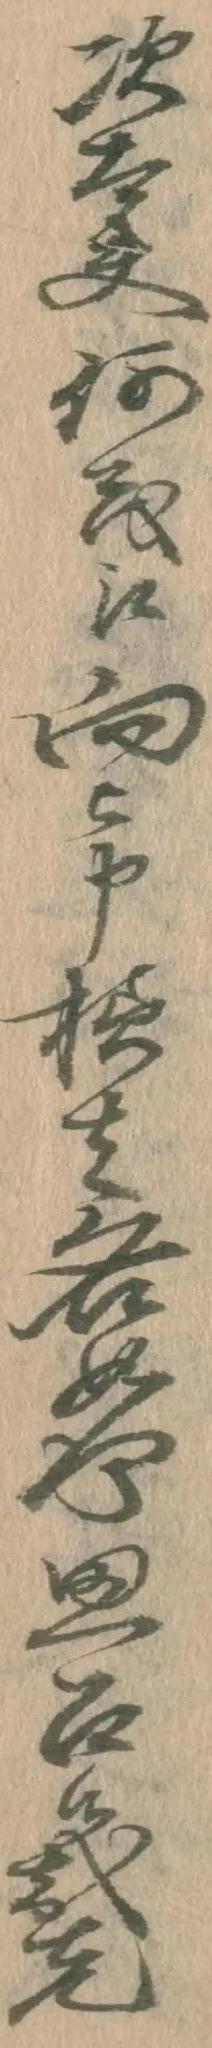次太夫何茂江向被申様者各如何思召候哉先
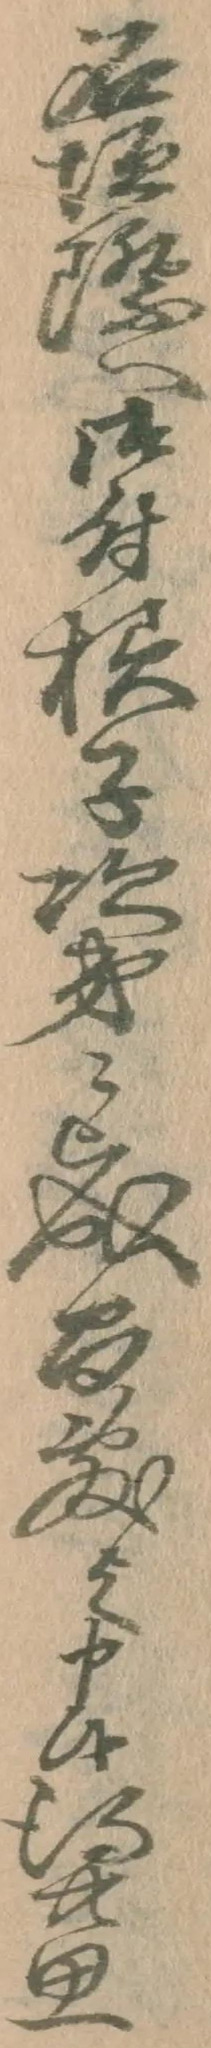石垣際へ御付様子次第に被成間敷与申候得共思
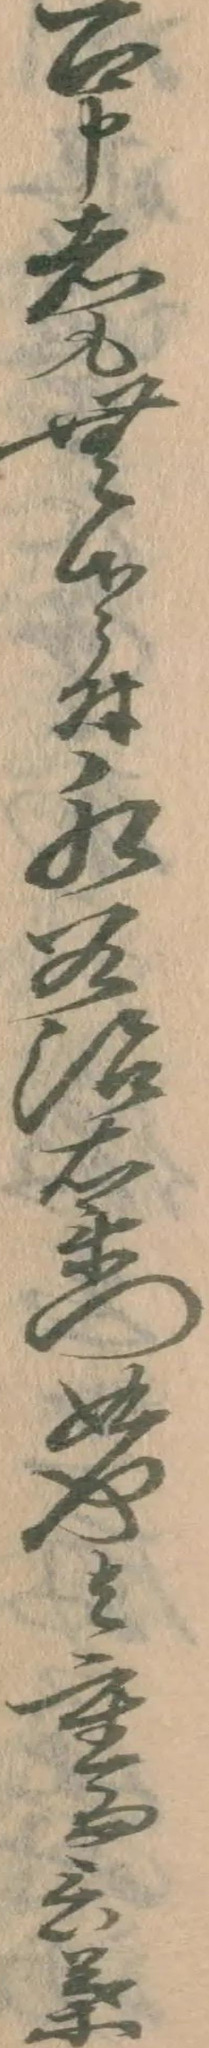召申者も無候に付水谷治右衛門如何与重而言葉
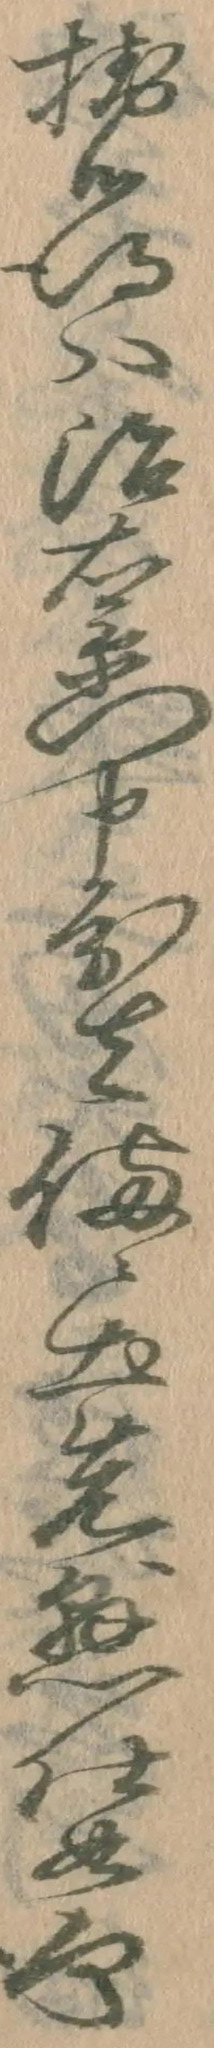掛候得は治右衛門申分者備に出先懸仕如何
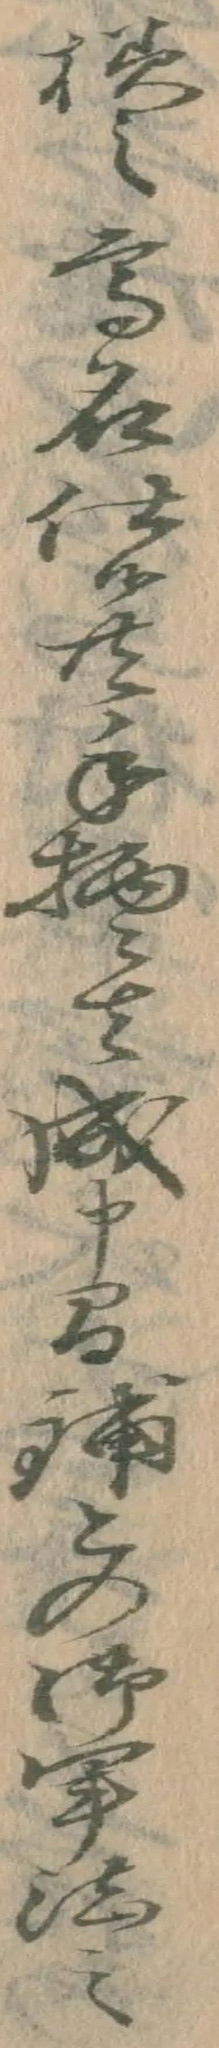様之高名仕候共其手柄に者成申間敷との御軍法之
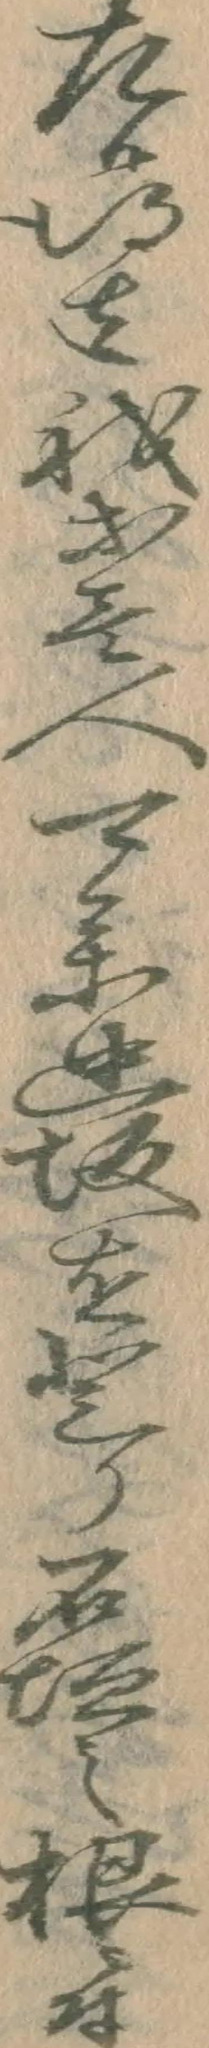左候得者我等壱人可参候迚坂を登り石垣之根に付
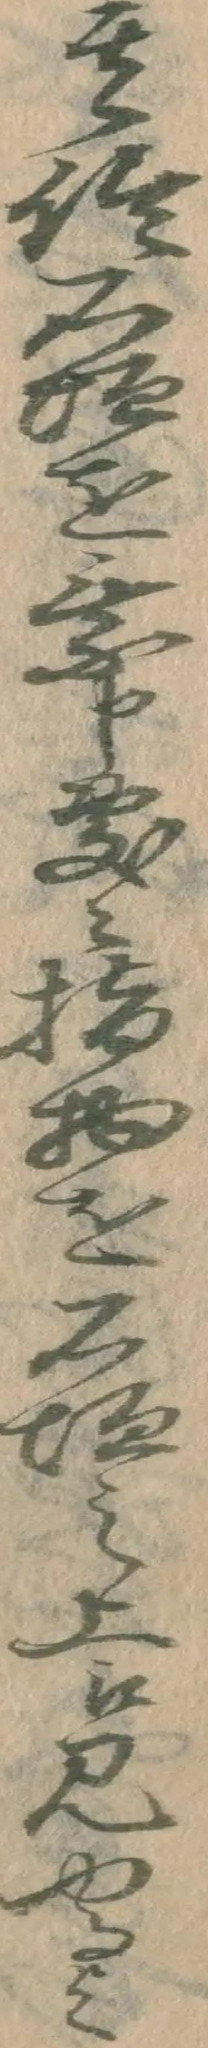其侭石垣を乗申處に指物を石垣之上江見ゆる与
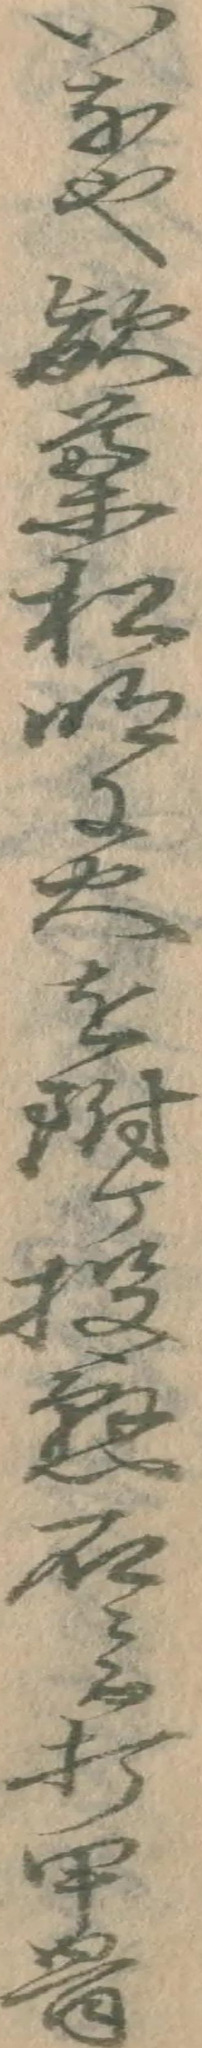いなや敵葉松明尓火を附け投懸石に而打甲冑
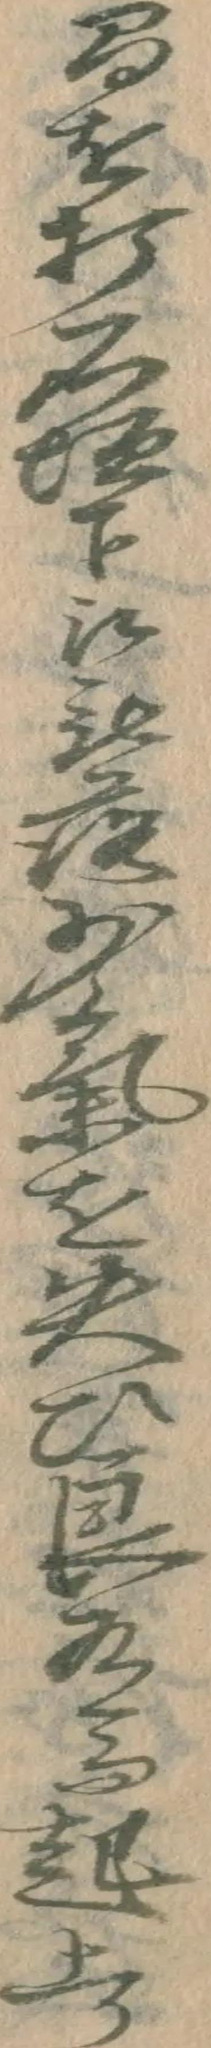間を打石垣下江被落少気を失ひ良有而起上り
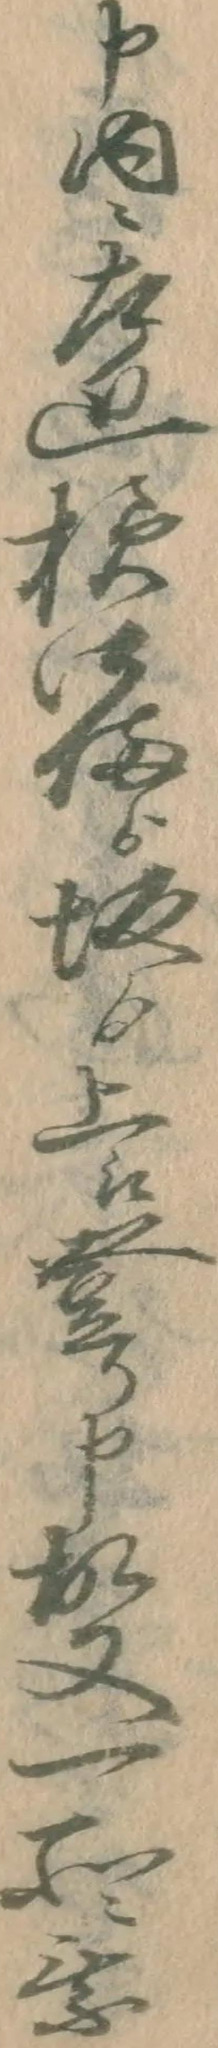申内に左近様御備ゟ坂ゟ上江登り申故又一所に乗
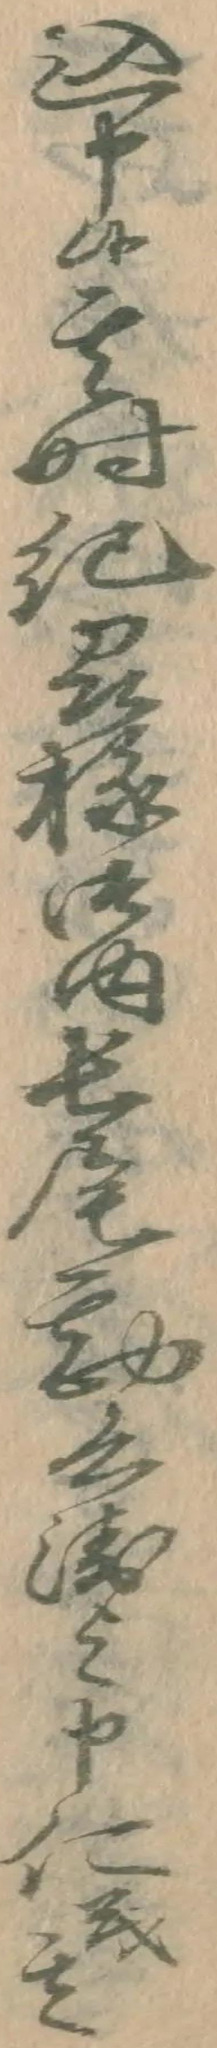込申候其時紀州様御内長尾勘兵衛与申仁茂其

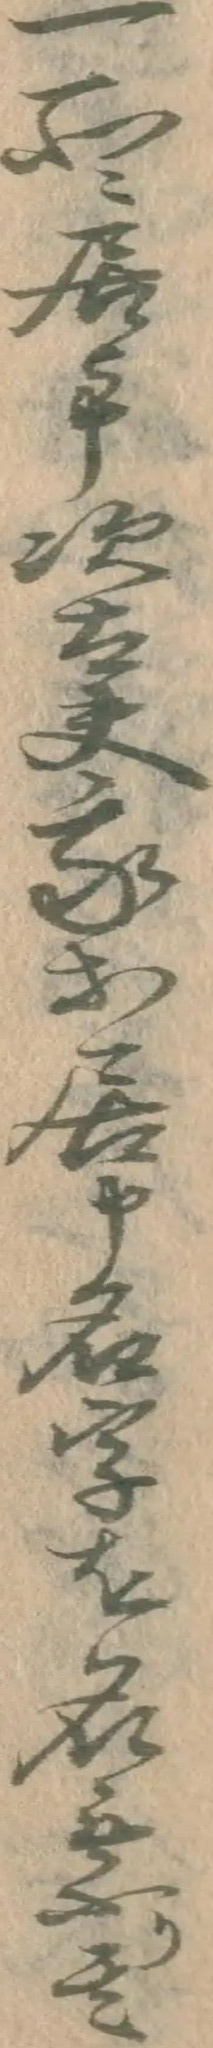一所に居被申次太夫我等居申名字を名乗り其
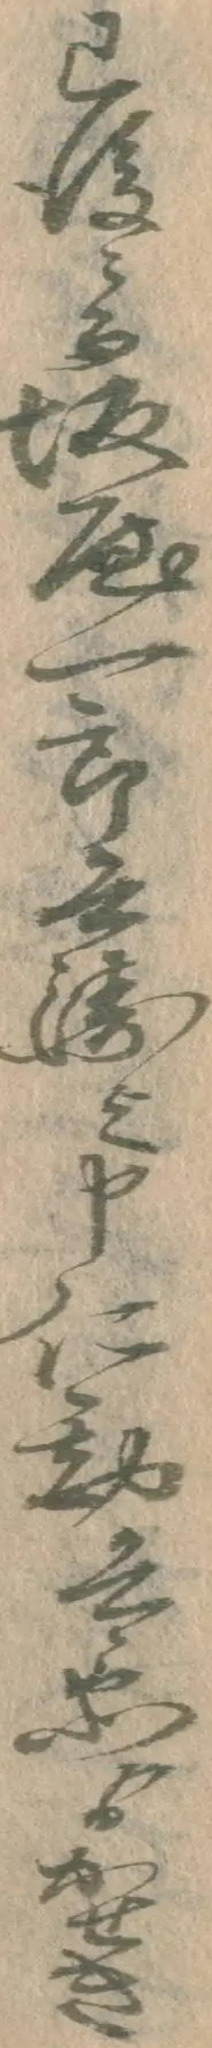己後に而坂屋一郎兵衛与申仁勘兵衛ゟかせき
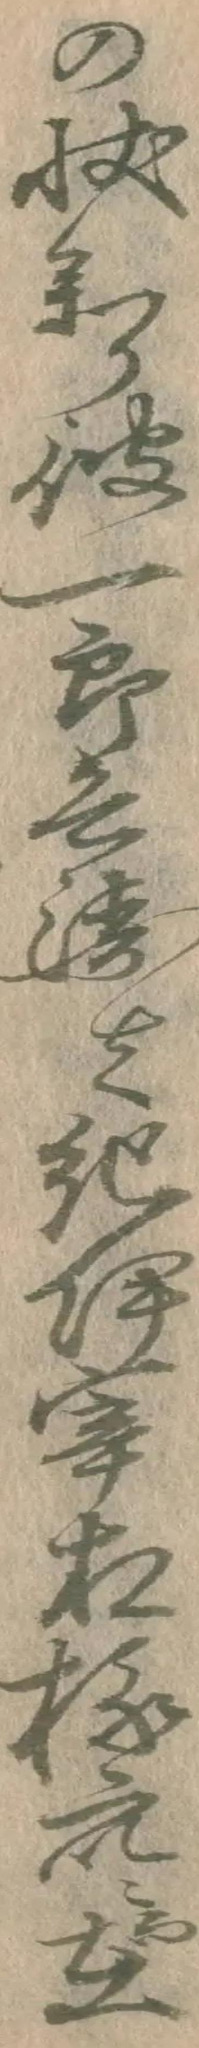の状参り彼一郎兵衛者紀伊宰相様衆に而在
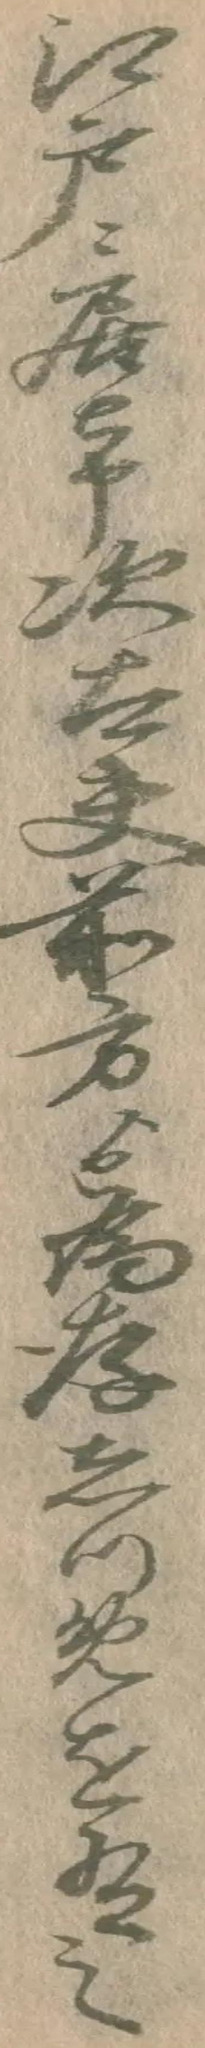江戸に居被申次太夫前方ゟ為存志川免を有之
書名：切支丹御退治記 49巻. [8]
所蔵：国立国会図書館 National Diet Library, JAPAN
